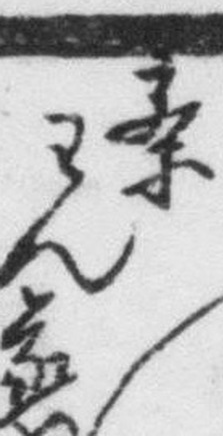わん蒸
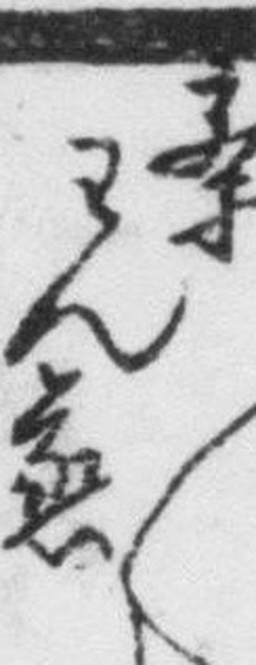わん蒸
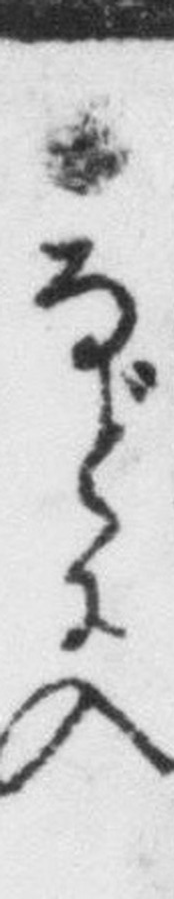などに入
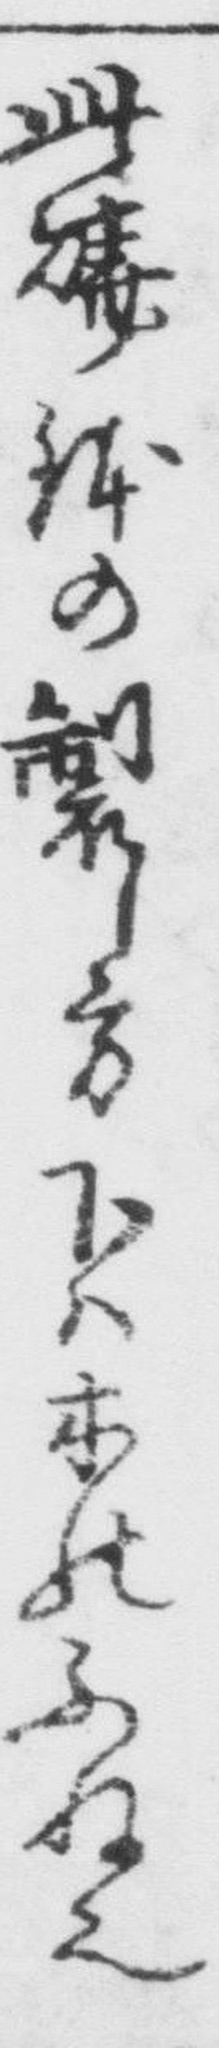此焼鉢の製し方下は木のふね也
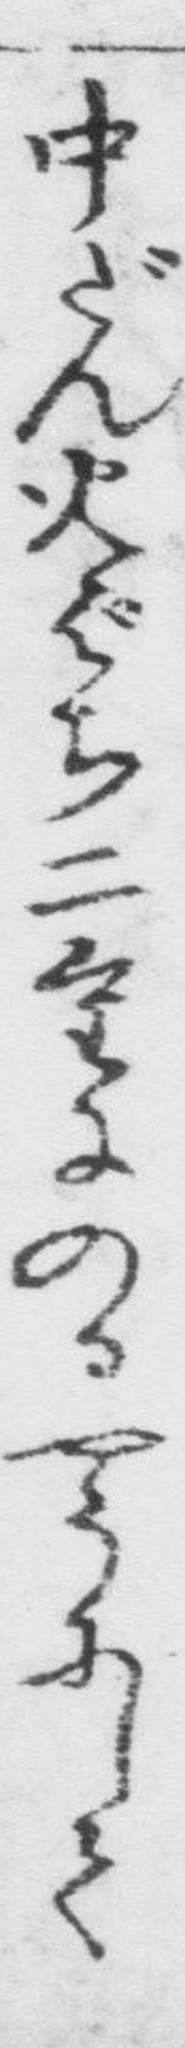中だん火ばち二重にのるやうにして
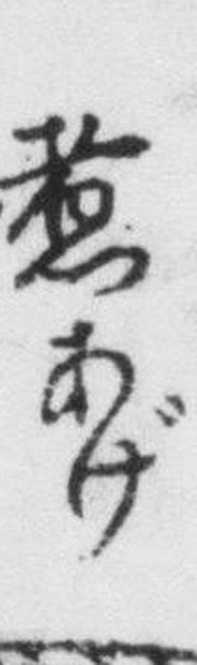煮あげ
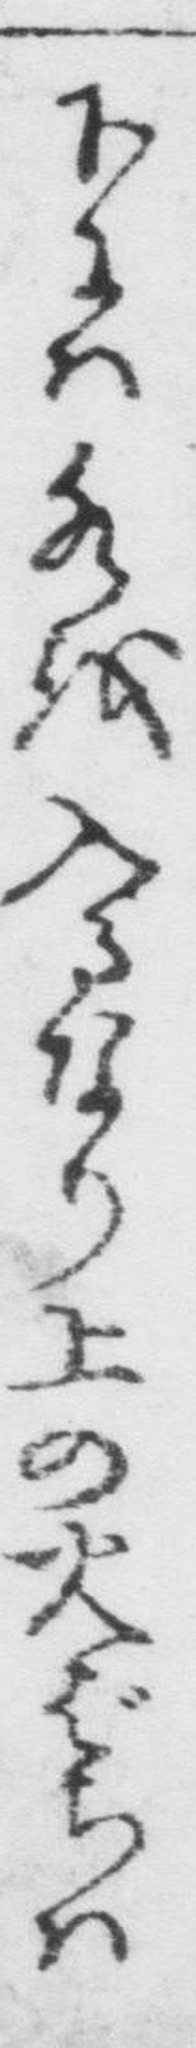下には水を入るなり上の火ばちは
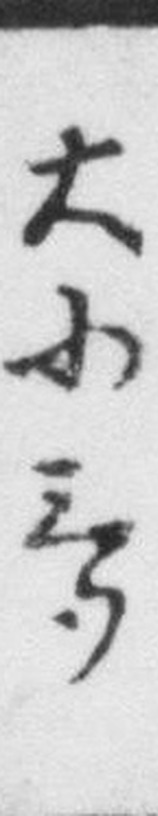大小三つ
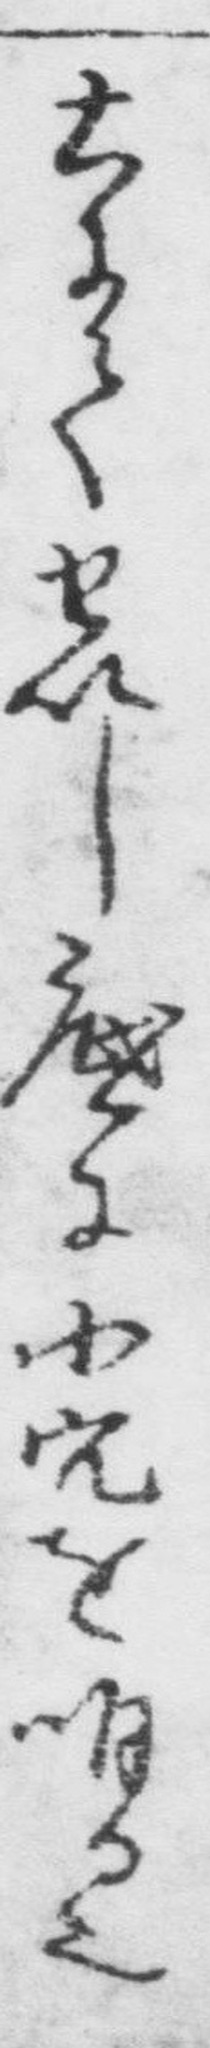土にてせいし底に小穴を明る也
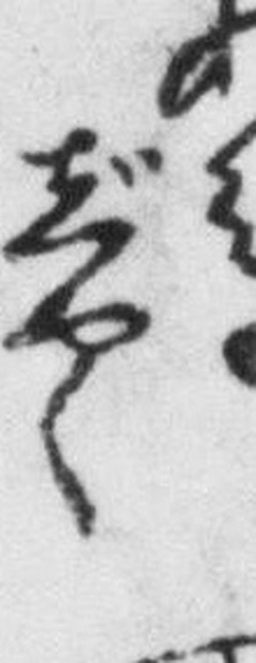じやく
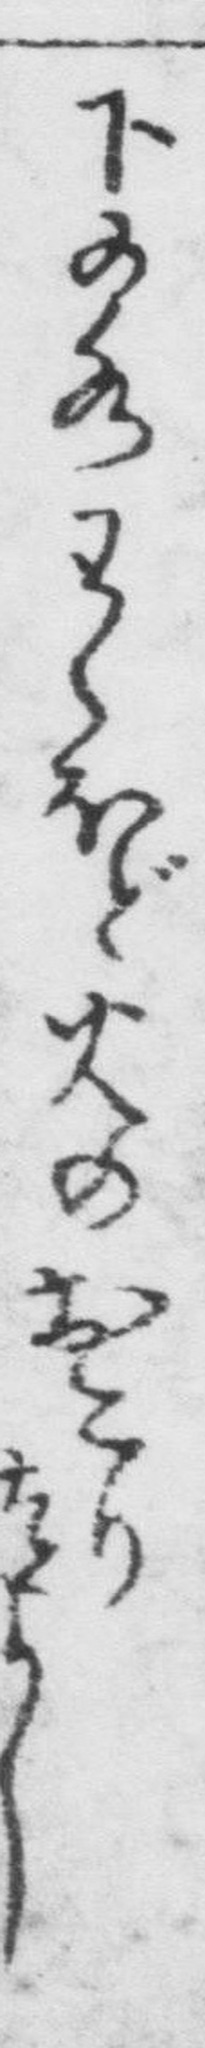下の水わくほど火のおこり
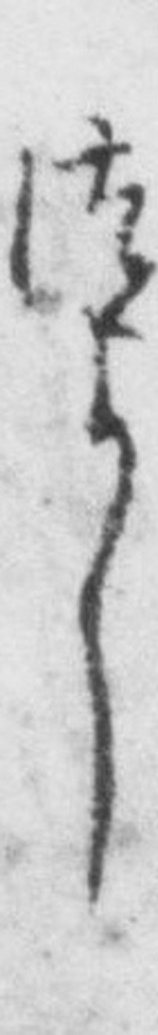つよし

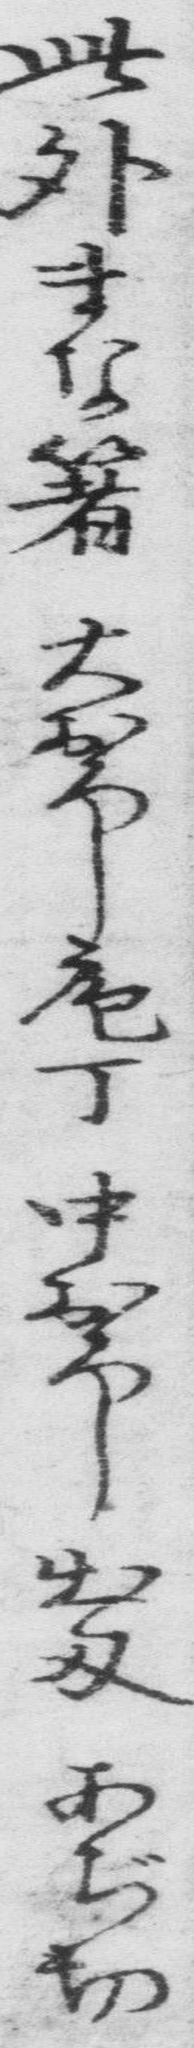此外まな箸大おろし庖丁中おろし出刃あぢ切
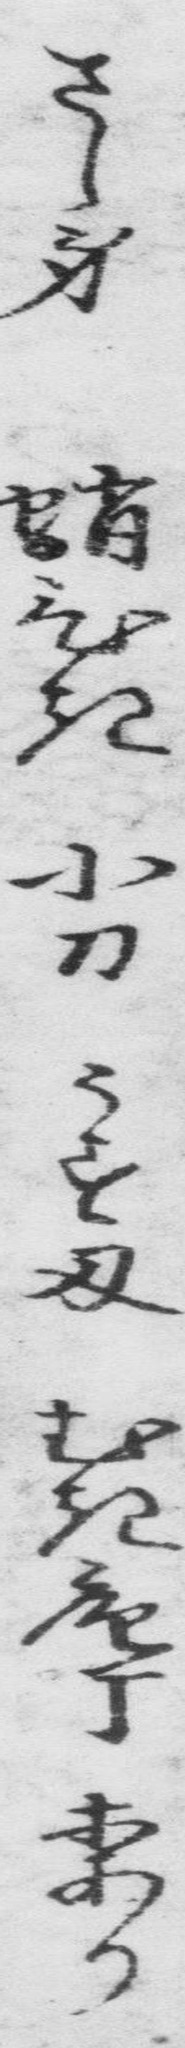さし身鮹ひき小刀うす刃むき庖丁等あり
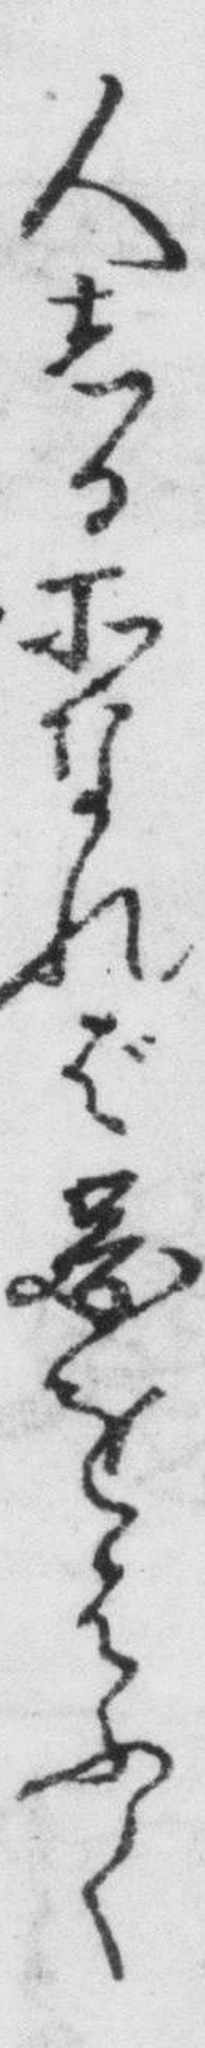人しる所なれば図をはふく
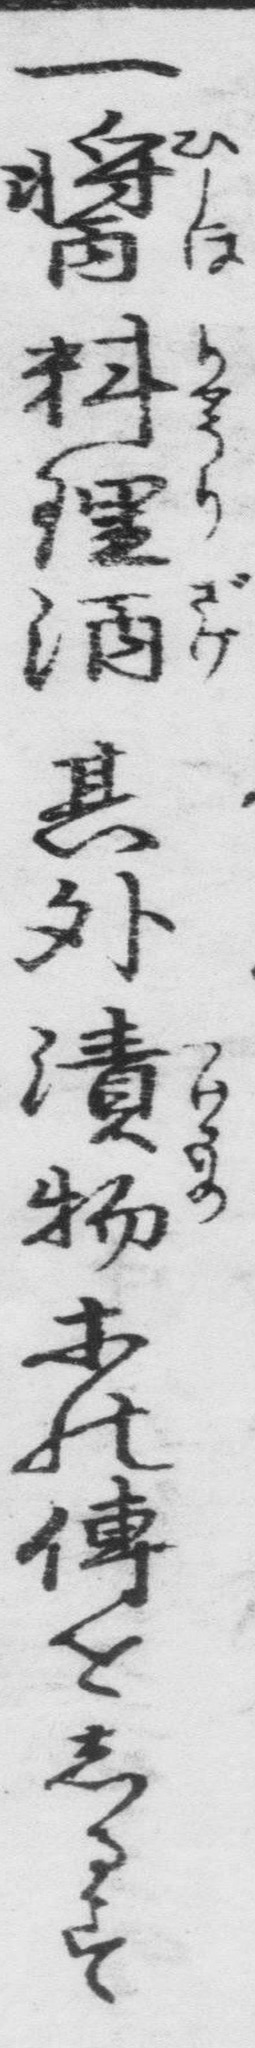一醤料理酒其外漬物等の伝をしるす
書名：料理早指南
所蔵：大阪府立大学学術情報センター 国文学研究資料館
